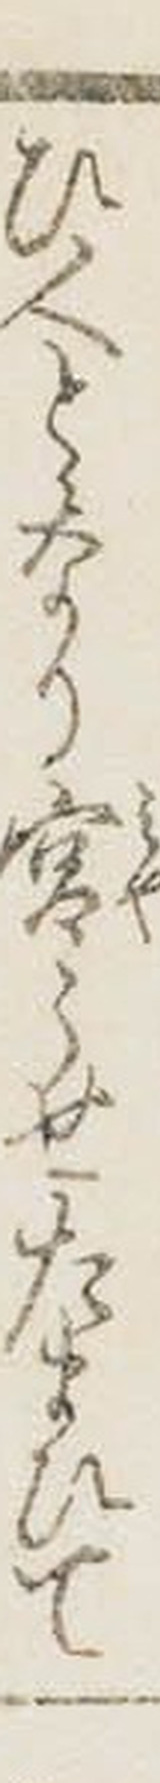ひ人となり宮うせたまひて
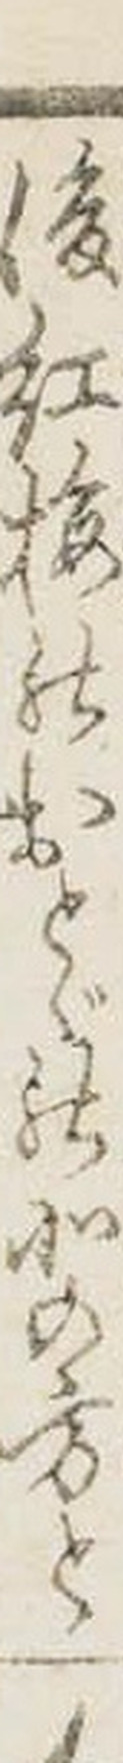後紅梅のおとゞの北の方と
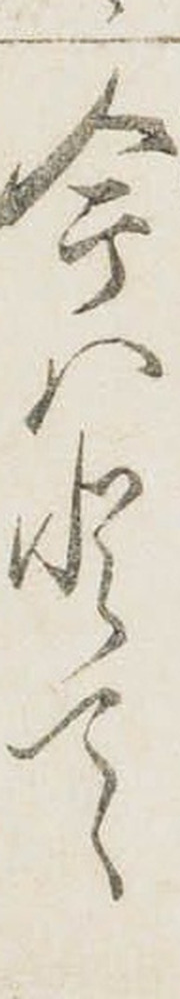今はとて
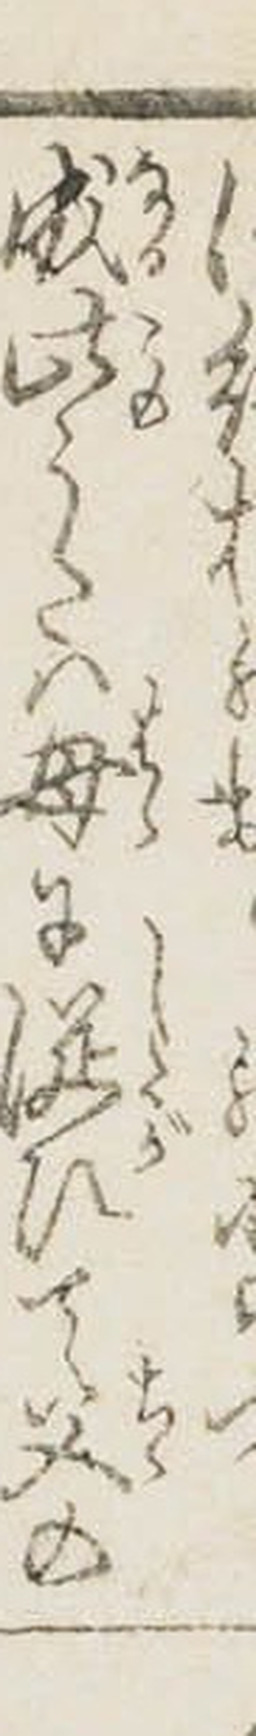成此うたは母に従ひて父の
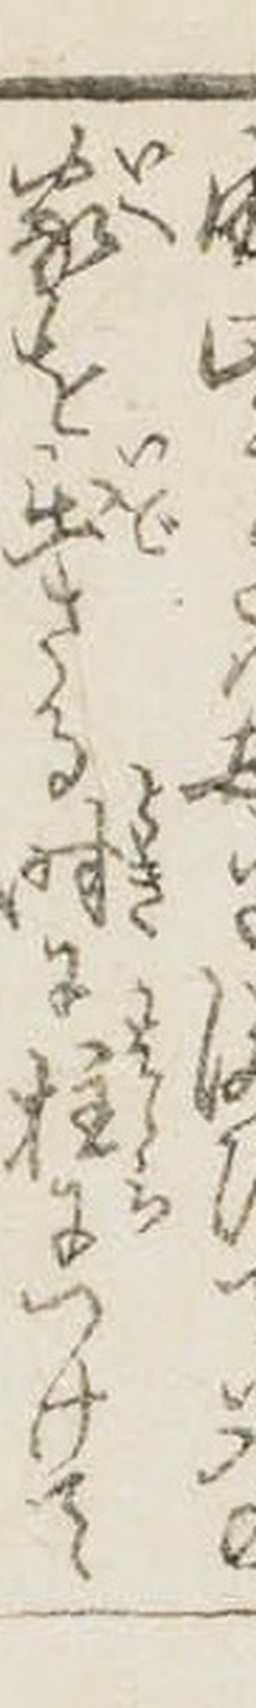家を出さる時に柱につけて
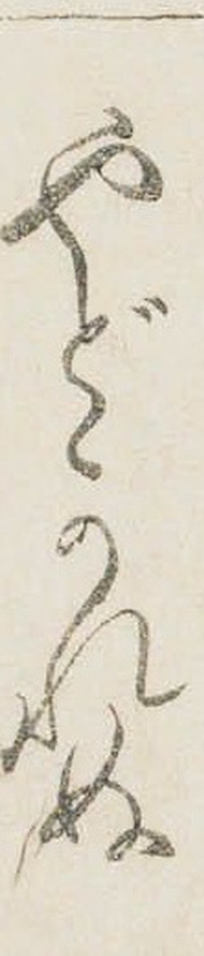やどかれぬ
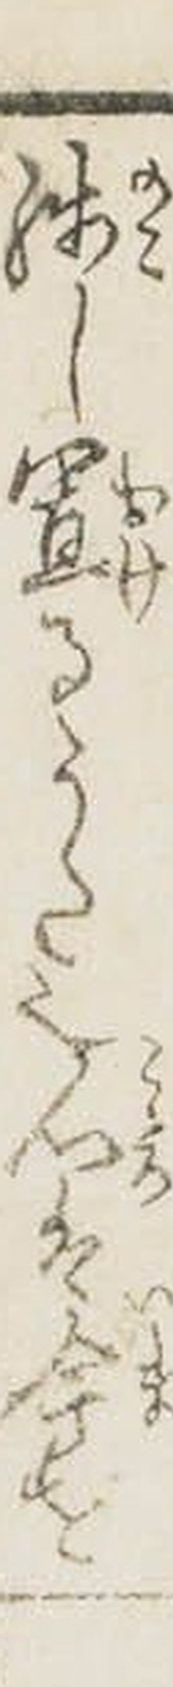残し置るうた也心は今を
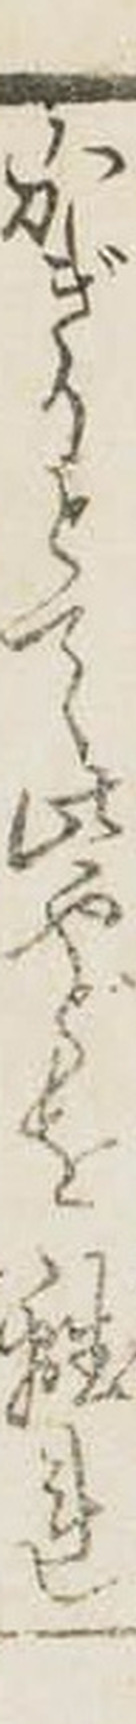かぎりとて此やどを離れ
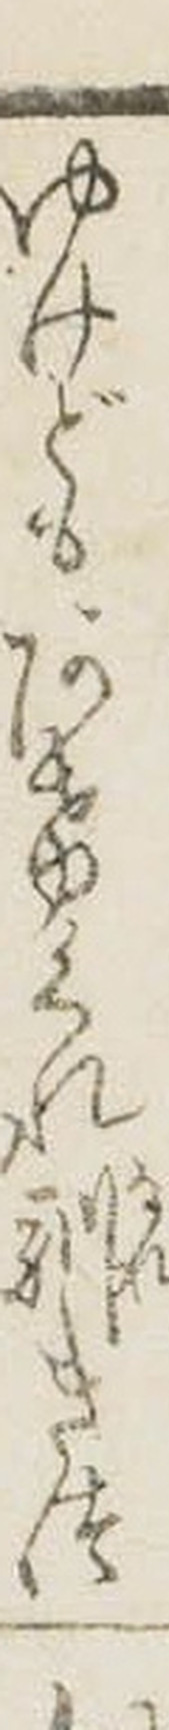ゆけどもあけくれ馴きつ
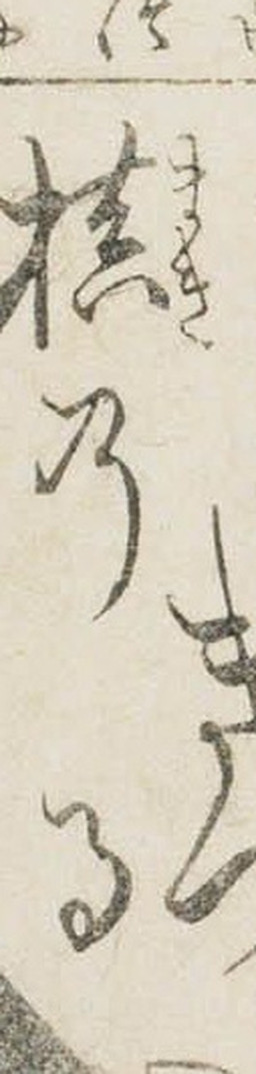槙のる
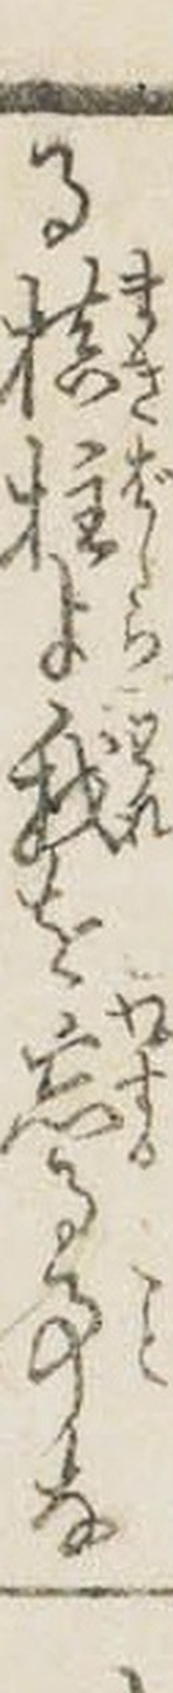る槙柱よ我を忘る事な
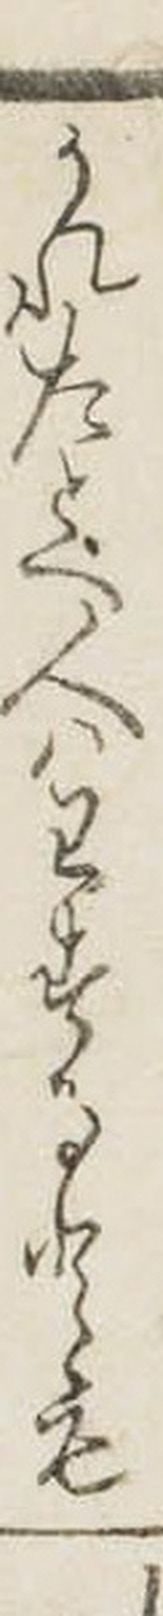かれたとへ人はわするとも
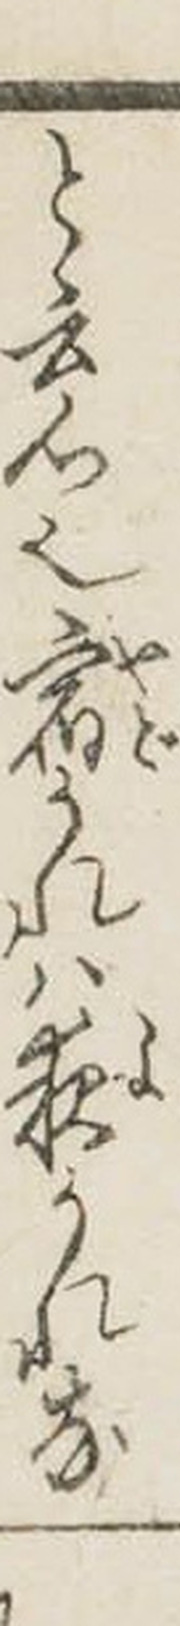と云心也宿かれは夜かれな
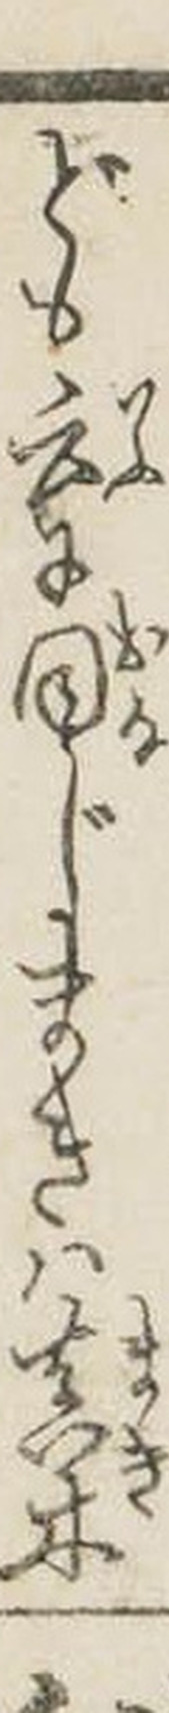ども云に同じまきは真木
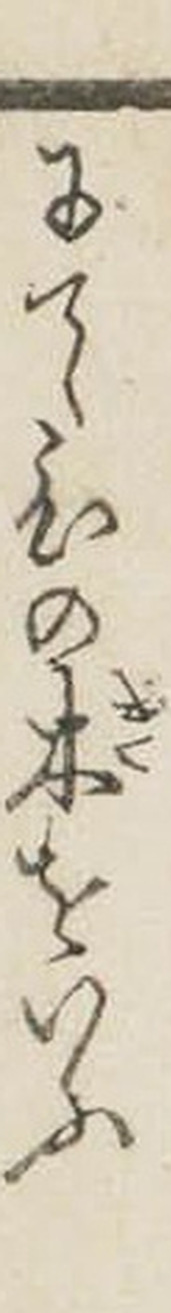にてひの木をいふ

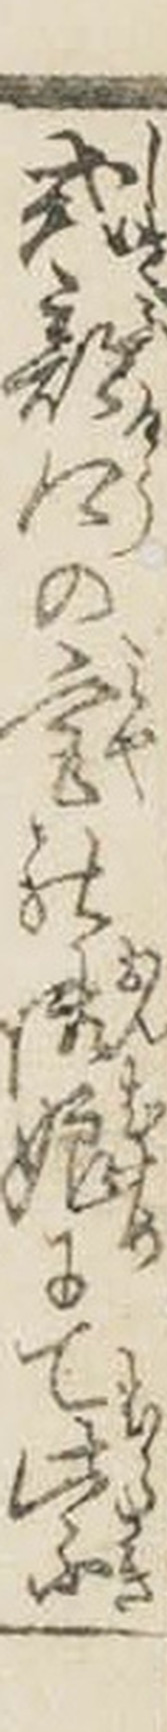式部卿の宮の御娘にて紫
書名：源氏百人一首
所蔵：東京学芸大学教育コンテンツアーカイブ
